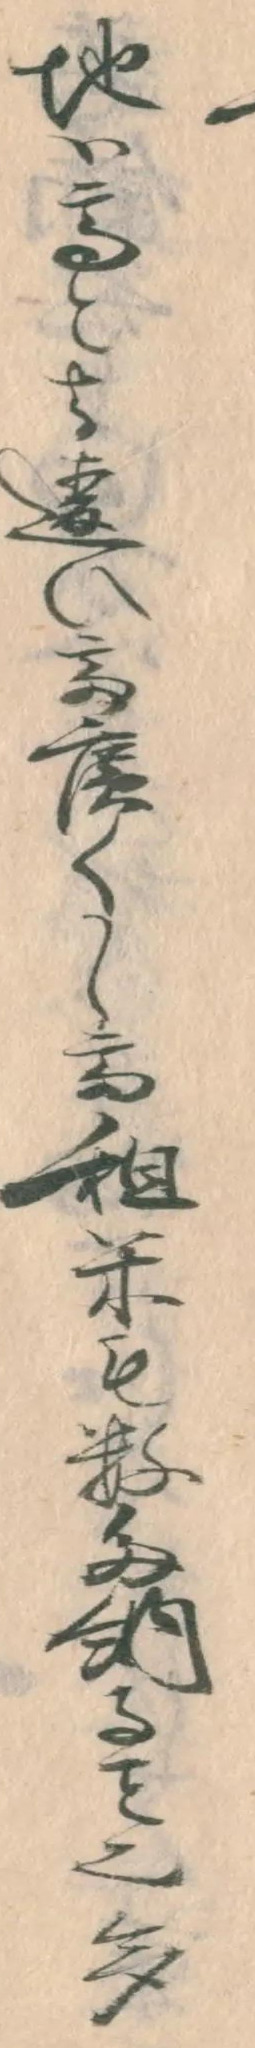地は高とは違ひて広くして祖米も数多納ること也多
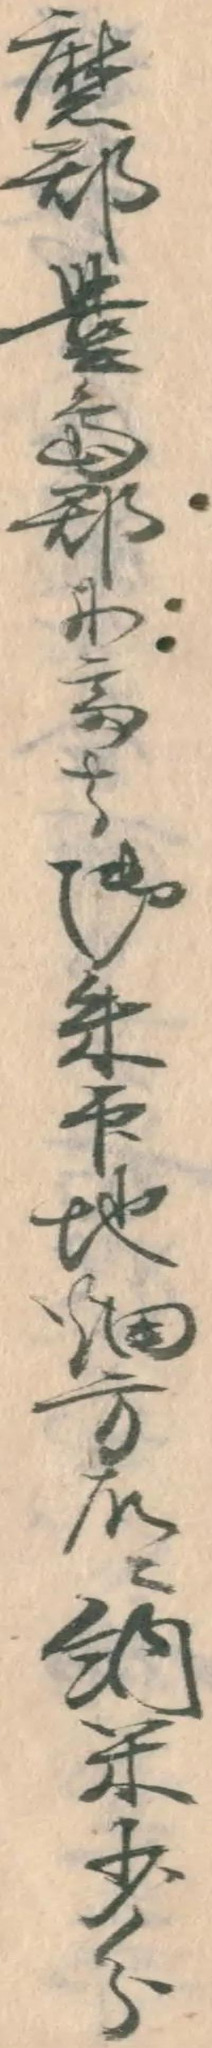磨郡豊島郡にては御朱印地細方故に納米少分
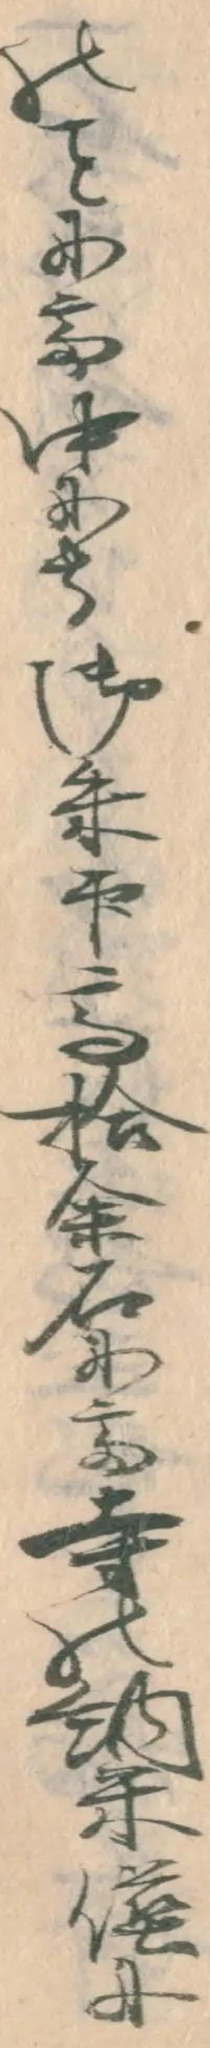のことにて中には御朱印高拾余石にて寺の納米僅に

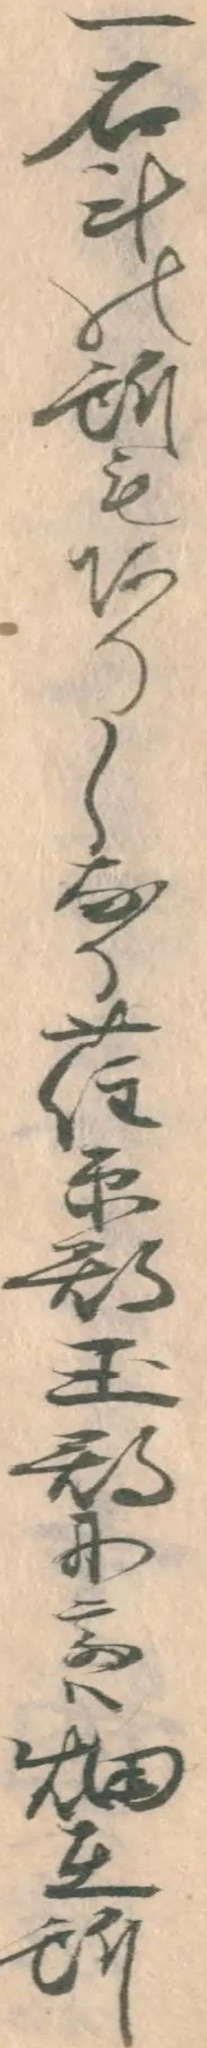一石斗の所もありしなり荏原郡玉郡にては畑在所
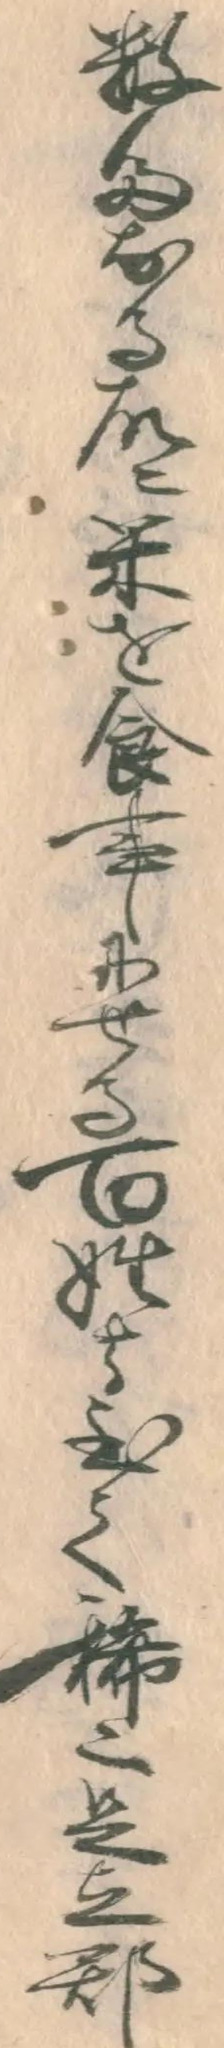数多なる故に米を食事にせる百姓は至て稀也足立郡
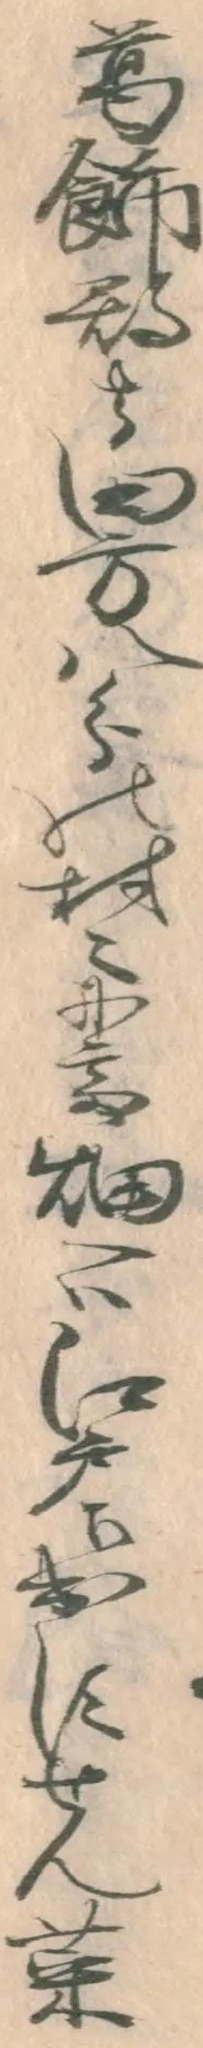葛飾郡は田方八分の村々にて畑へは江戸え出すせん菜
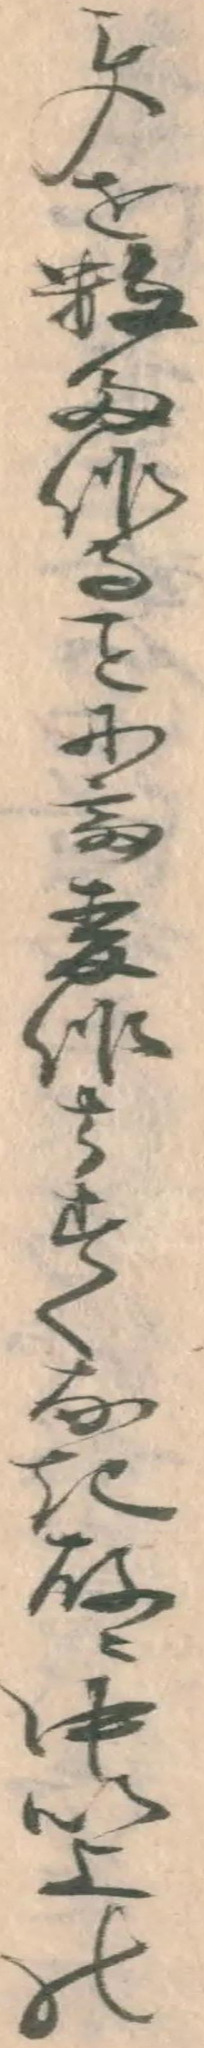ものを数多作ることにて麦作はすくなき故に中以上の
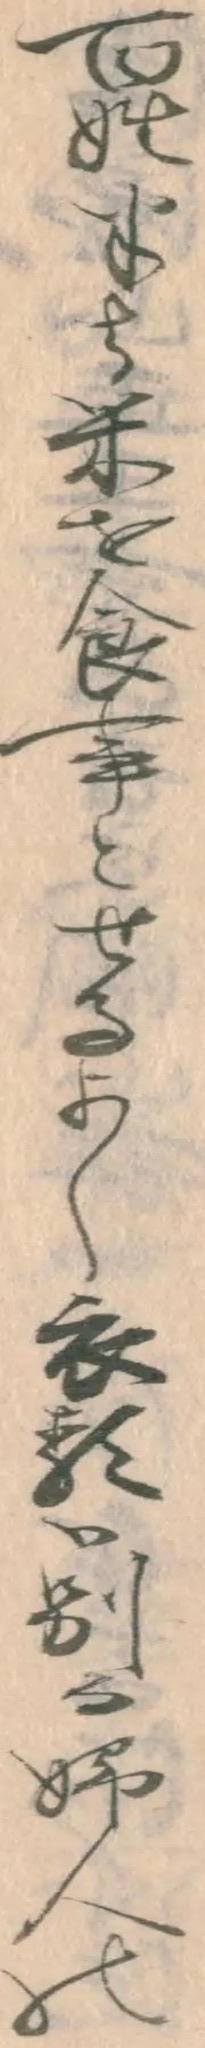百姓半は米を食事とせるよし衣類は別て婦人の
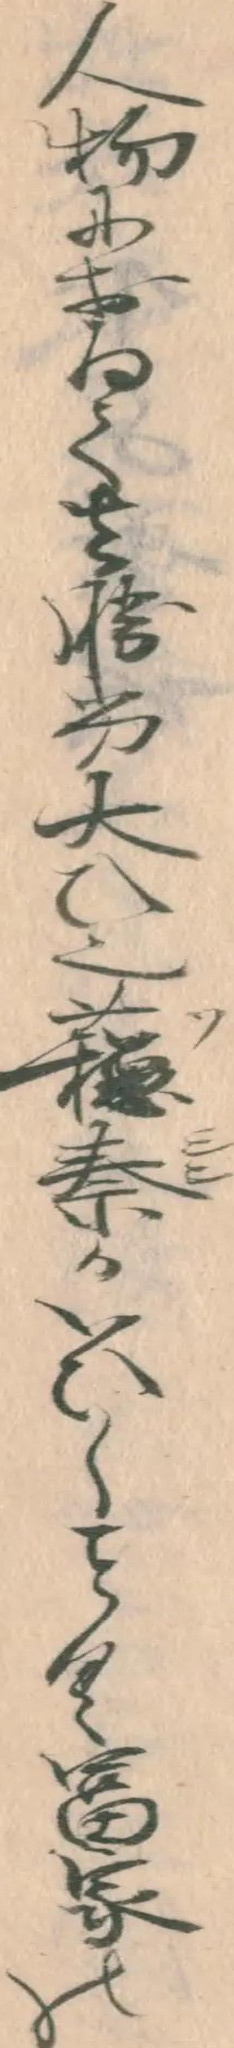人物におゐて其勝劣大ひ也蘓泰かといひしことく富家の
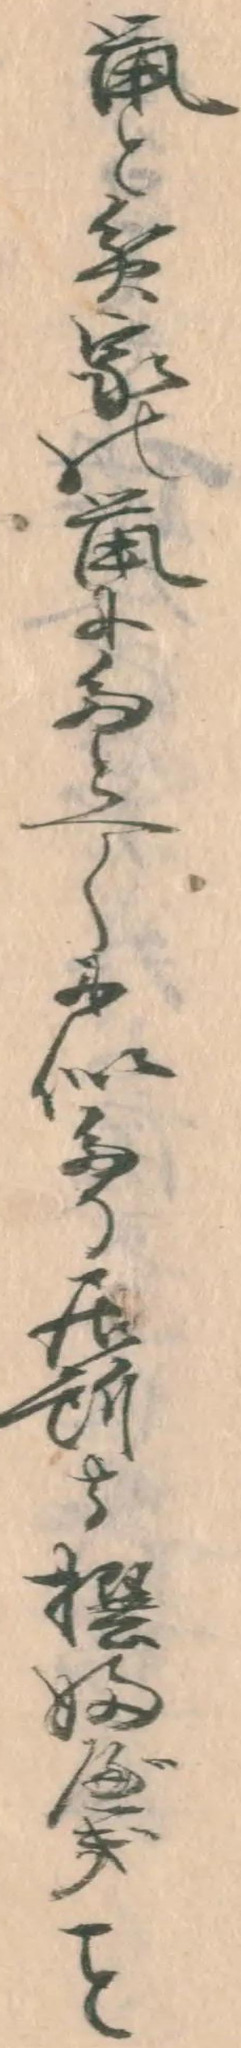鼠と貧家の鼠にたとへしに似たり居所は撰ふべきこと
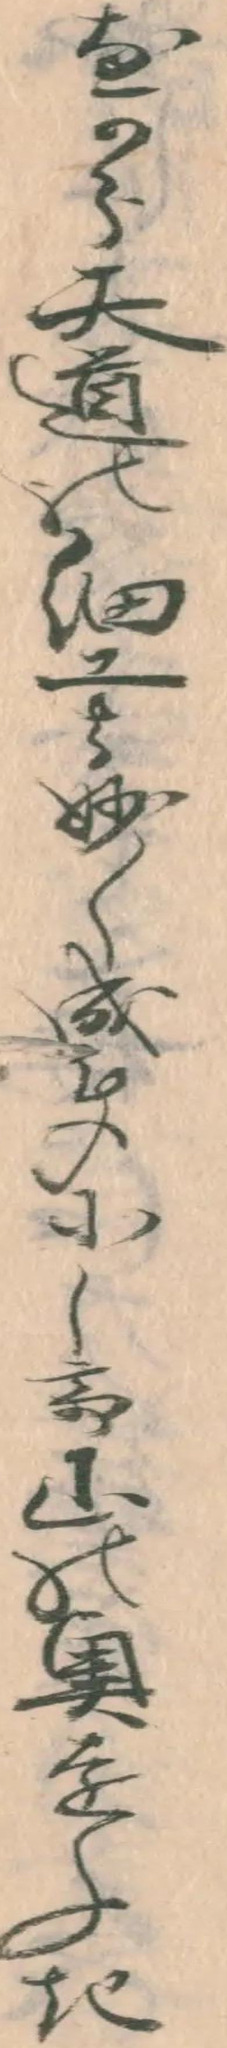なから天道の細工は妙〳〵成ものにして山の奥遠ふき
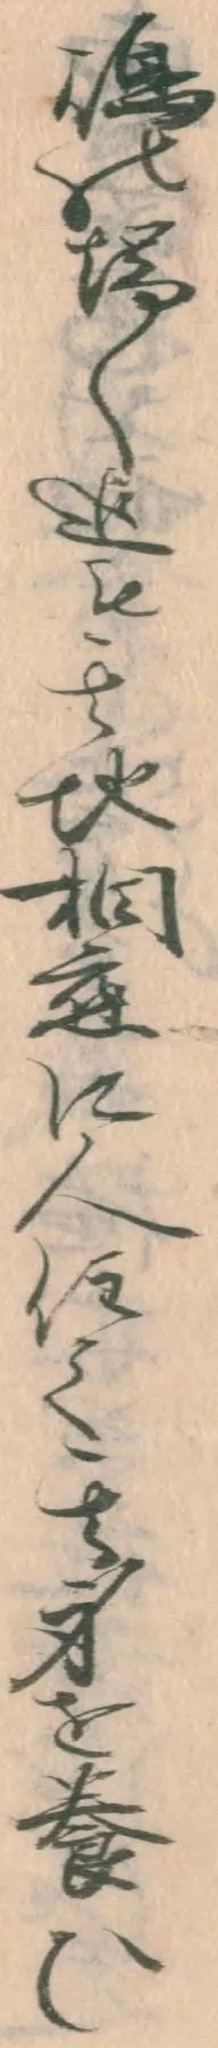島の端〳〵迄も其地相応に人住て其身を養ひ
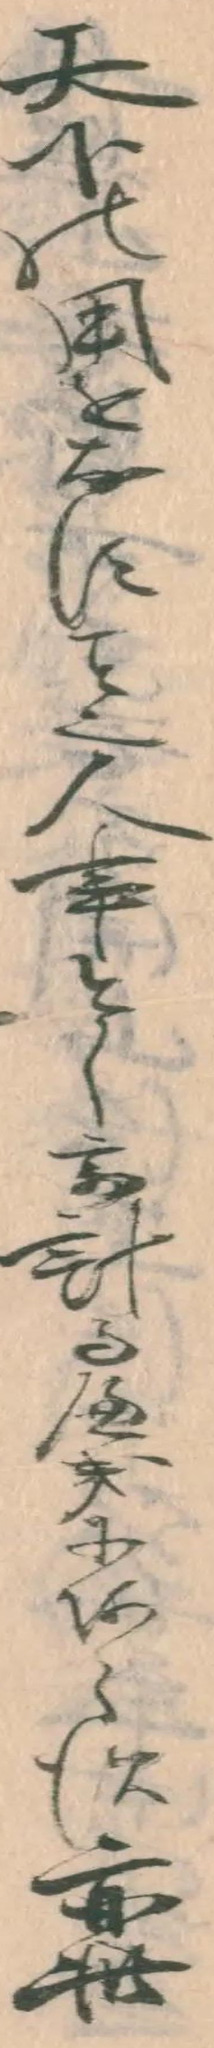天下の用をなすこと也人事として取計るへきにあらす亦此
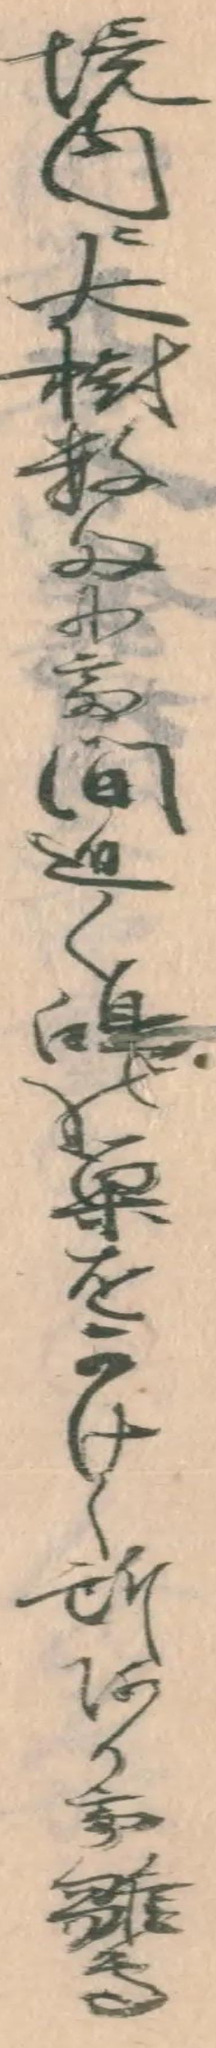境内に大樹数多にて間近く鴻の巣をかけし所ありて雛鳥
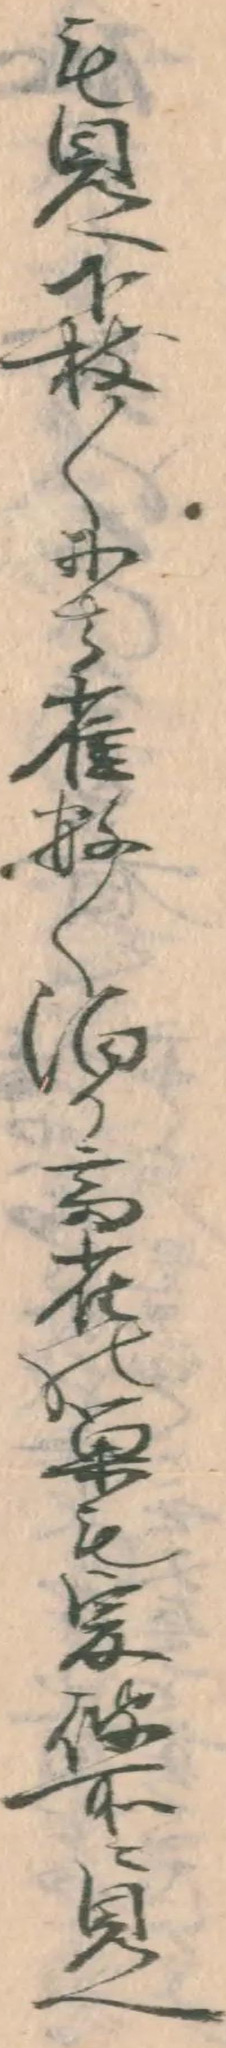も見へ下枝〳〵には雀数〳〵泊りて雀の巣も爰彼所に見へ
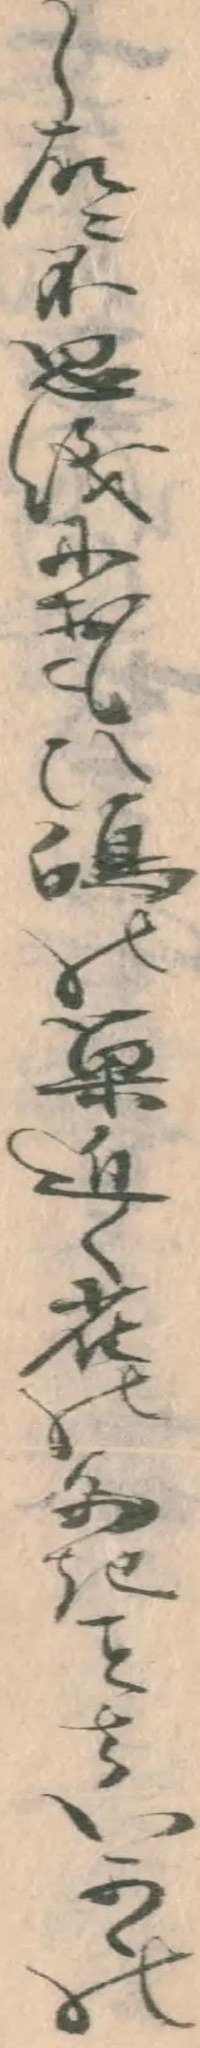し故に不思議におもひ鴻の巣近く雀の多きことはいかゝの
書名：四神地名録 6巻. [4]葛飾郡
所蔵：国立国会図書館 National Diet Library, JAPAN
